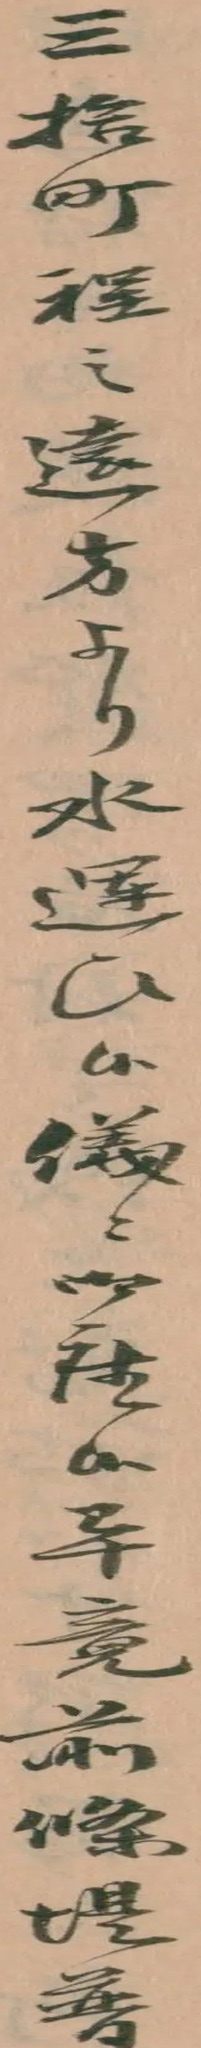三拾町程之遠方より水運ひ候儀ニ御座候畢竟前条之堤普
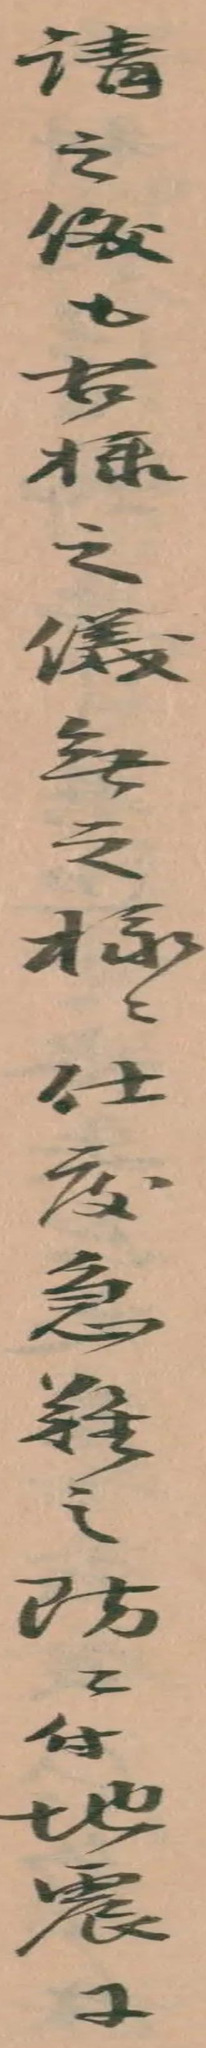請之儀も右様之儀無之様二仕度急難之防ニ付地震に
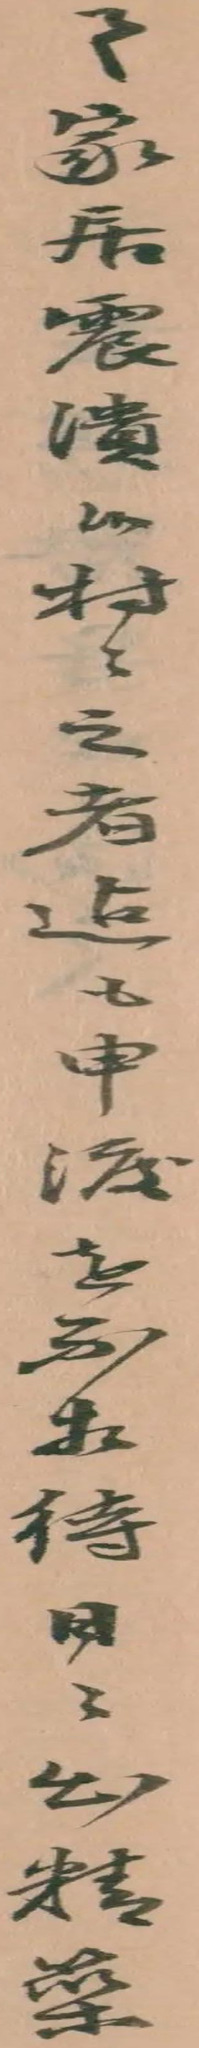て家居震潰候村々之者迄申渡を不相待日々出精築
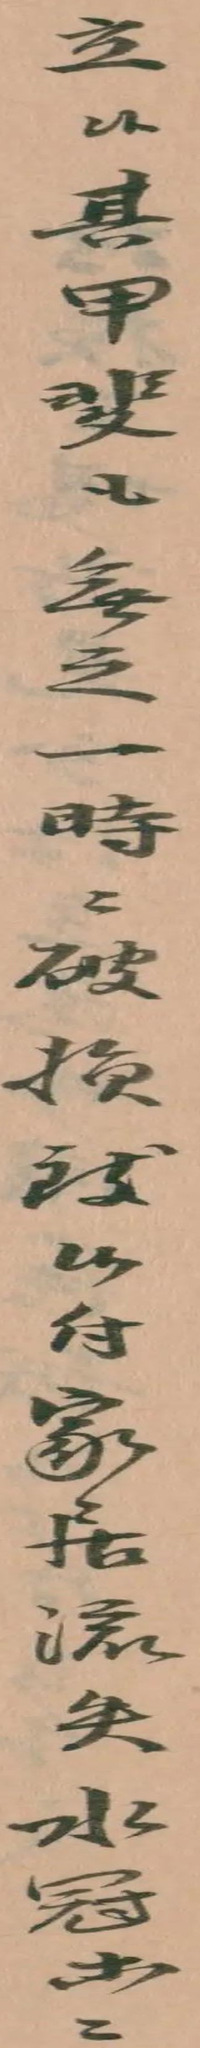立候其甲斐も無之一時ニ破損致候付家居流失水冠り等二
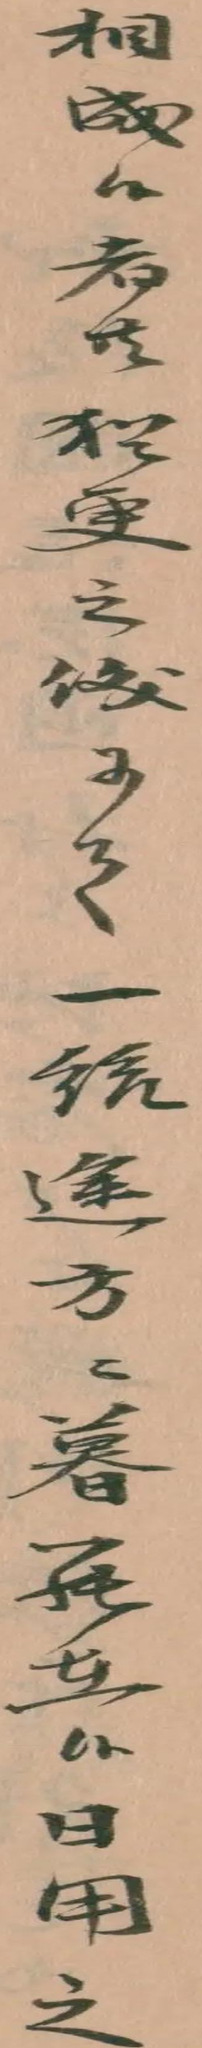相成候者共ハ猶更之儀にて一統途方ニ暮罷在候日用之
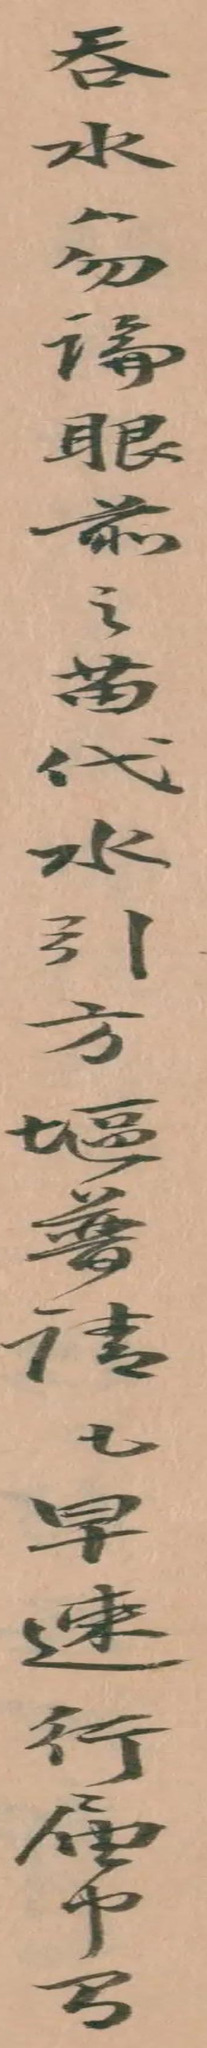呑水ハ勿論眼前之苗代水引方堰普請も早速行届申間
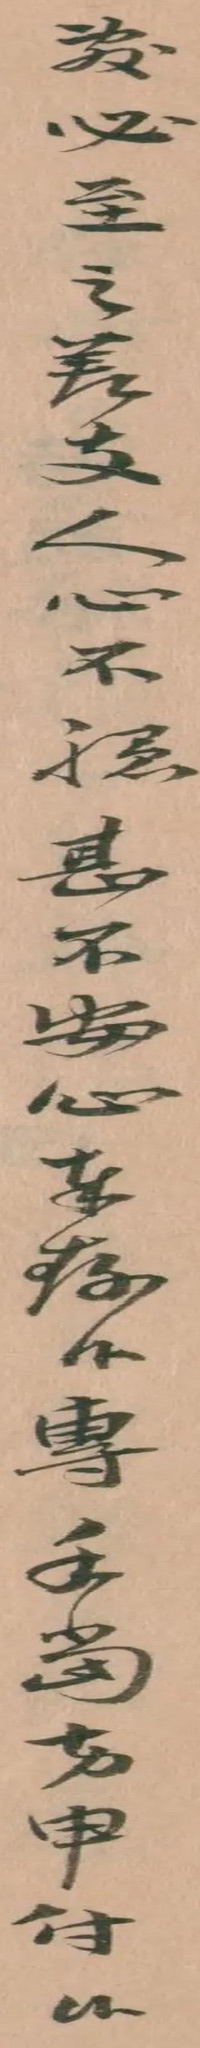敷必至之差支人心不穏甚不案心奉存候専手当方申付候
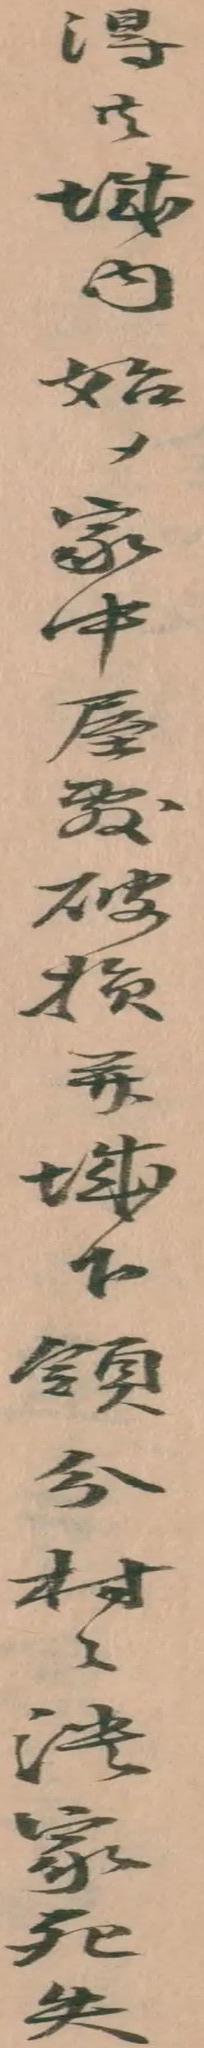得共城内始メ家中屋敷破損并城下領分村々潰家死失
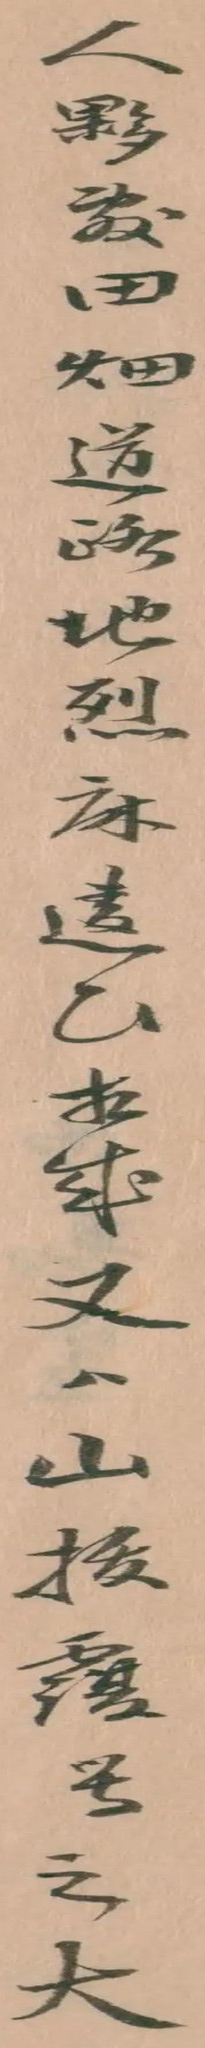人夥敷田畑道路地裂床違ひ相成又ハ山抜覆等之大
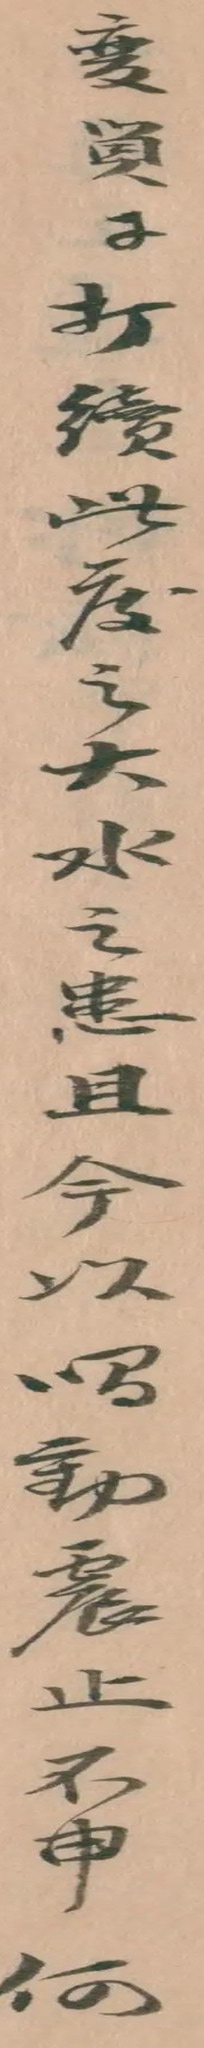変災に打続此度之大水之患且今以鳴動震止不申何
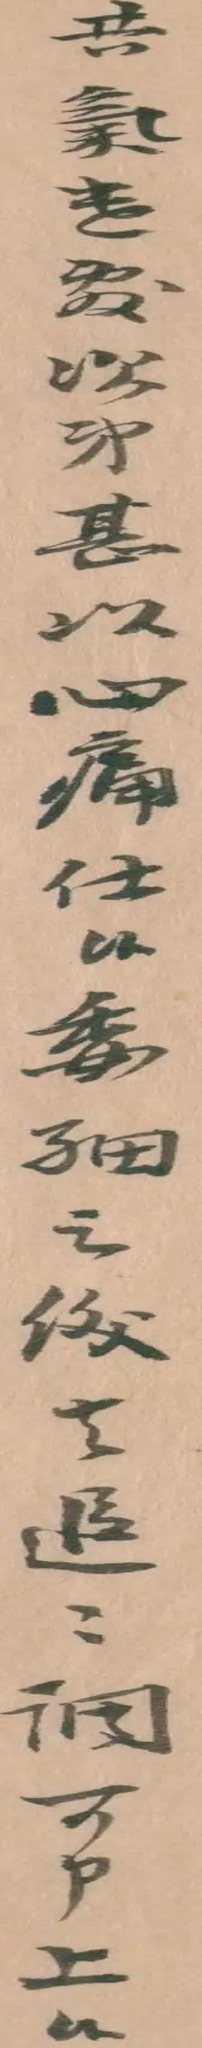共気遣敷次第甚以心痛仕候委細之儀者追々調可申上候
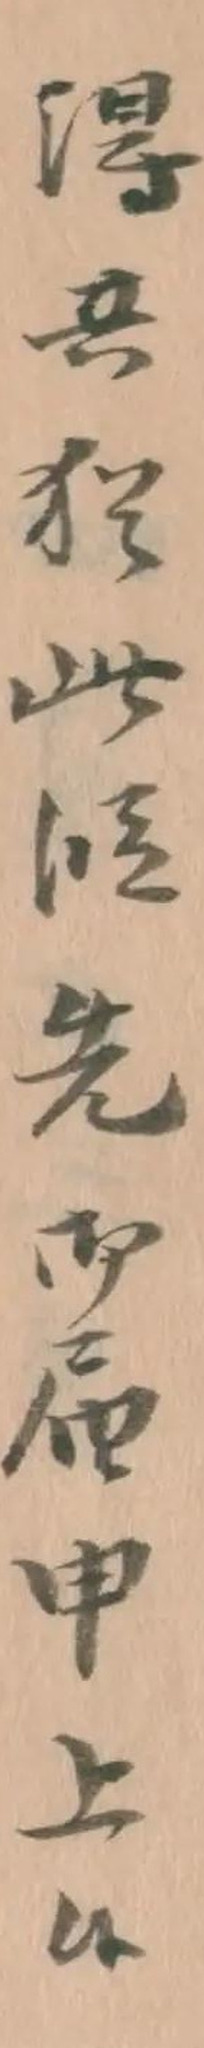得共猶此段先御届申上候

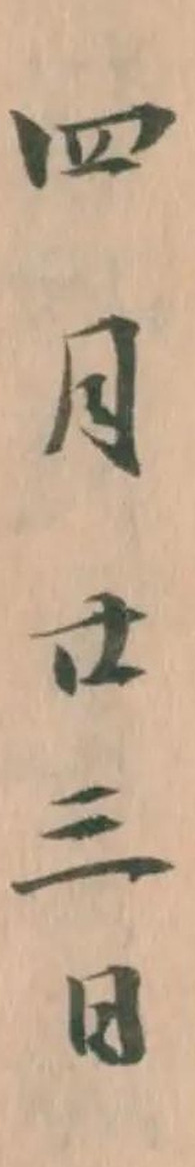四月廿三日
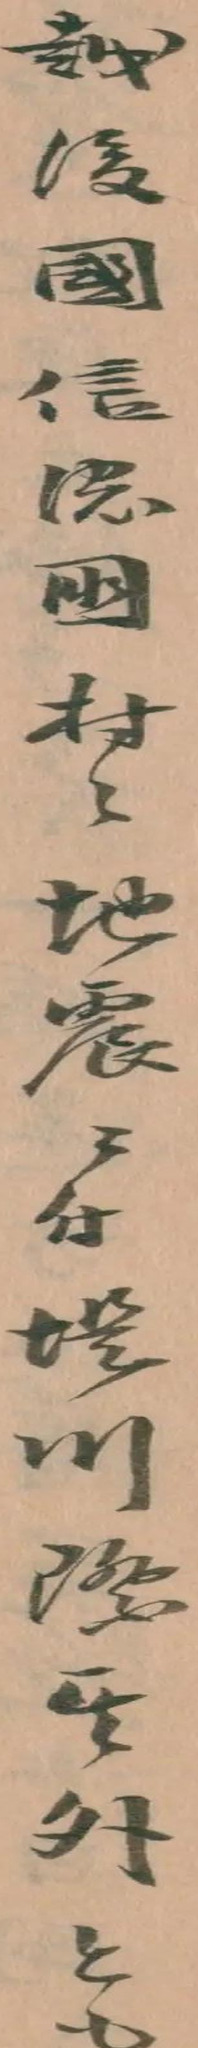越後国信濃国村々地震二付堤川際其外とも
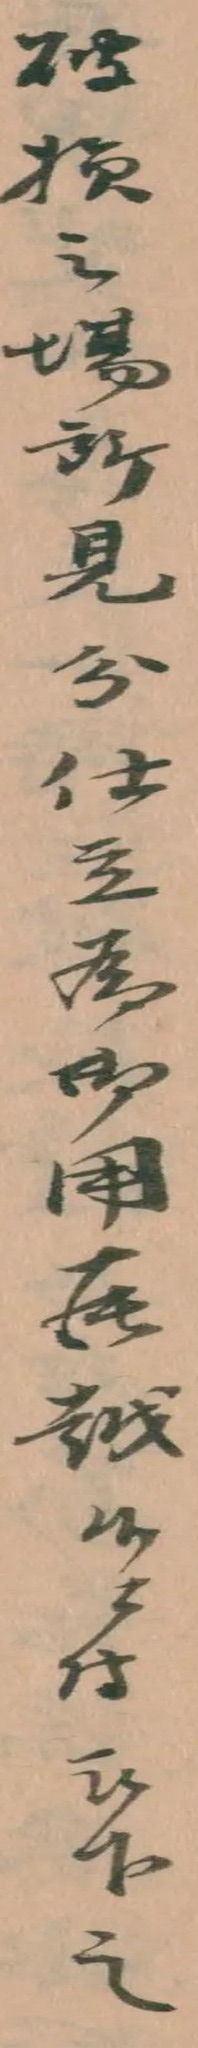破損之場所見分仕立為御用罷越候二付被下之
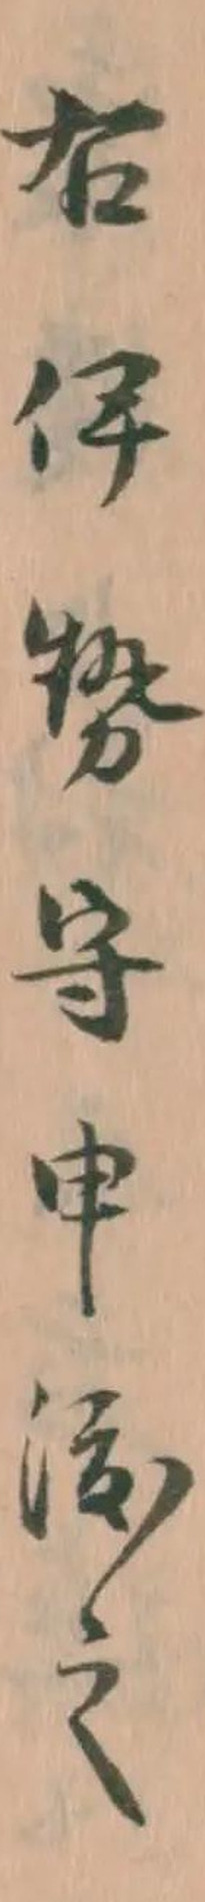右伊賀守申渡之候
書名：地災撮要. 巻3(地震之部)-巻4(噴火之部)
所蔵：国立国会図書館 National Diet Library, JAPAN
